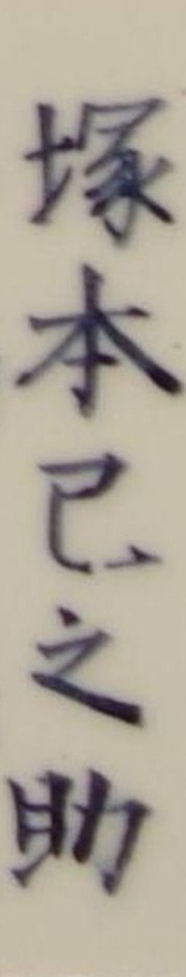塚本巳之助
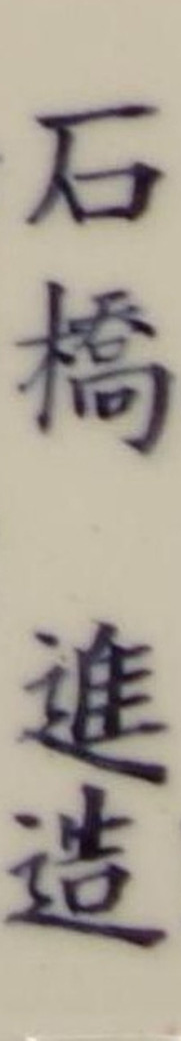石橋進造
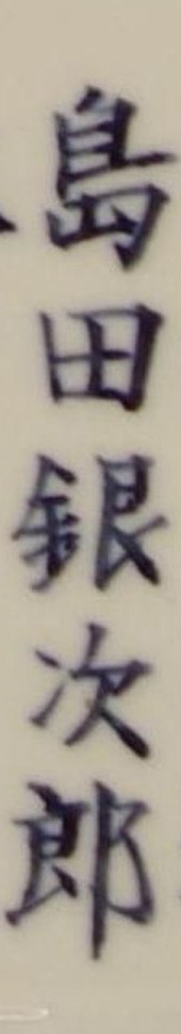島田銀次郎
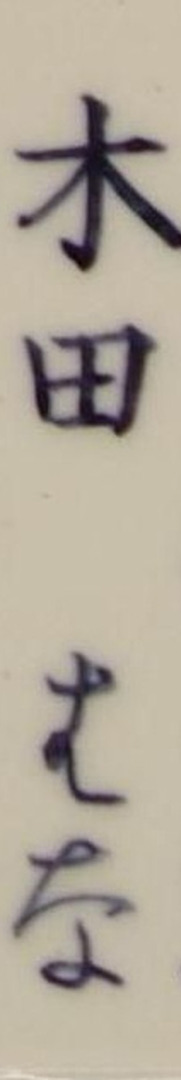木田はな
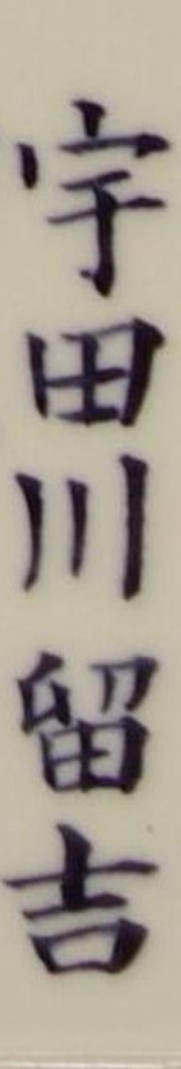宇田川留吉
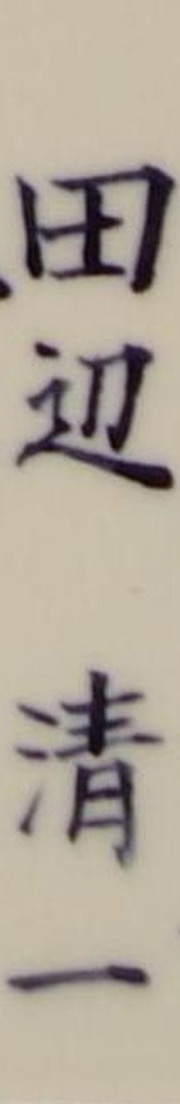田辺清一
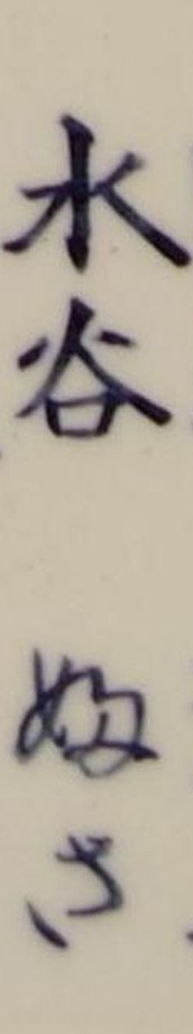水谷ふさ
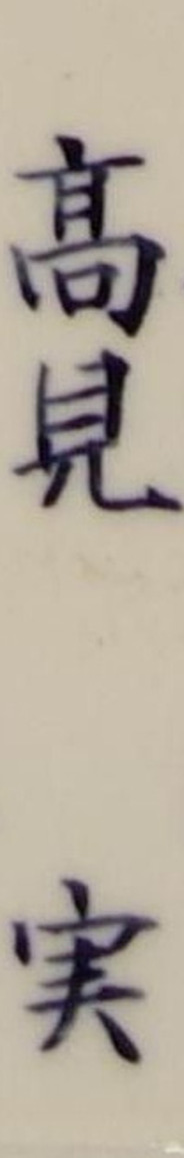高見実
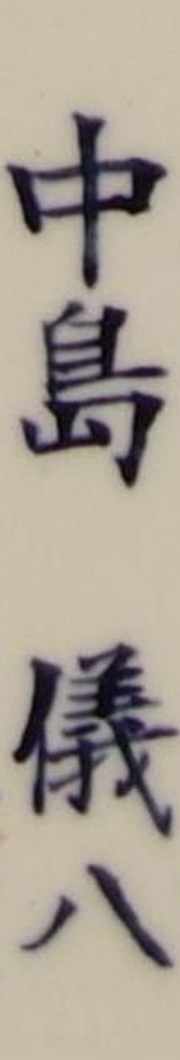中島儀八
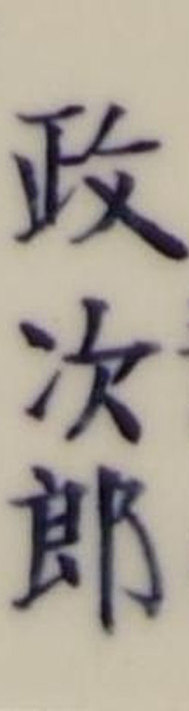政次郎
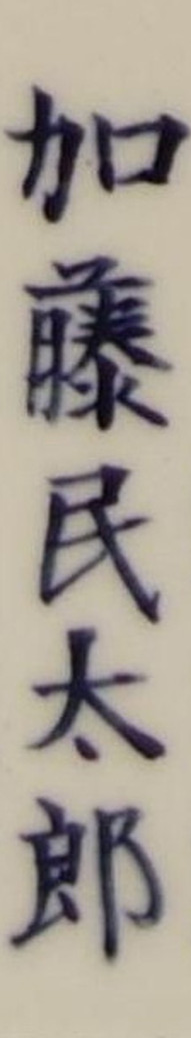加藤民太郎
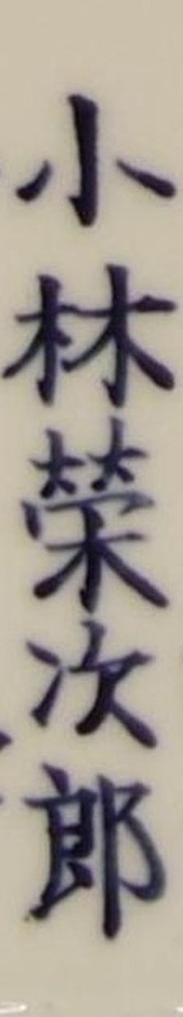小林榮次郎
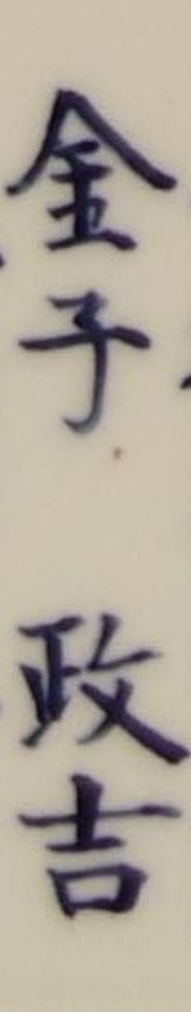金子政吉
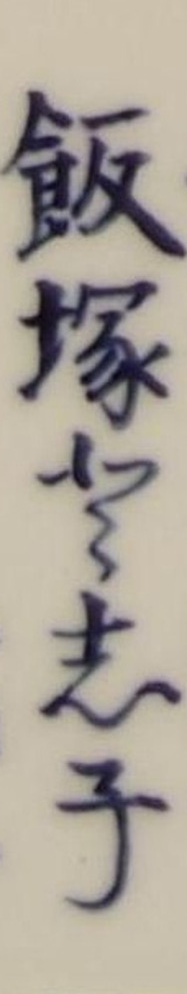飯塚とし子
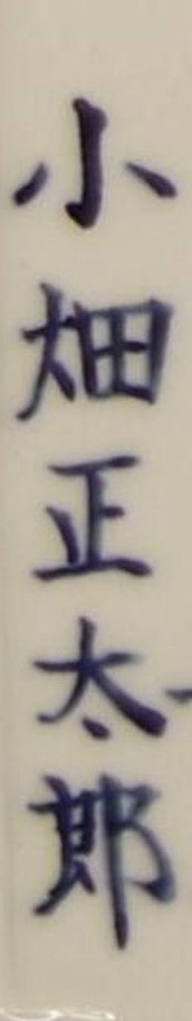小畑正太郎

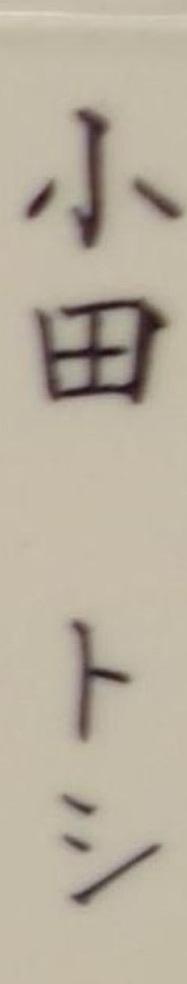小田トシ
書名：E~L
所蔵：高野山金剛峯寺
